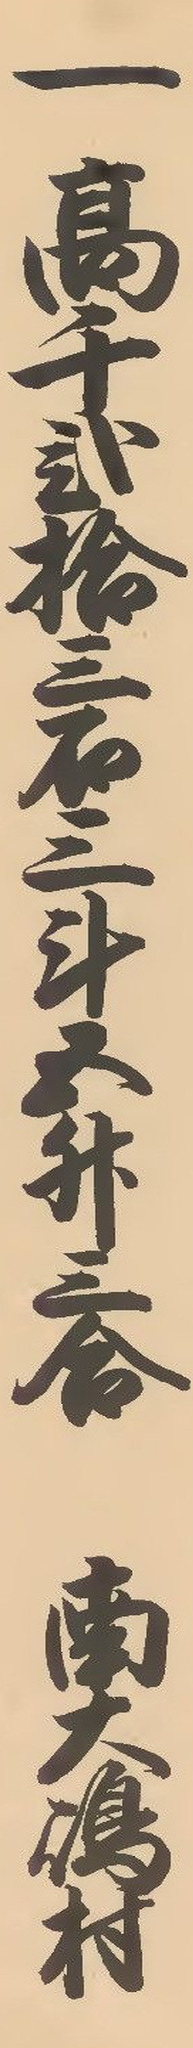一髙千弐拾三石三斗五升三合南大嶋村
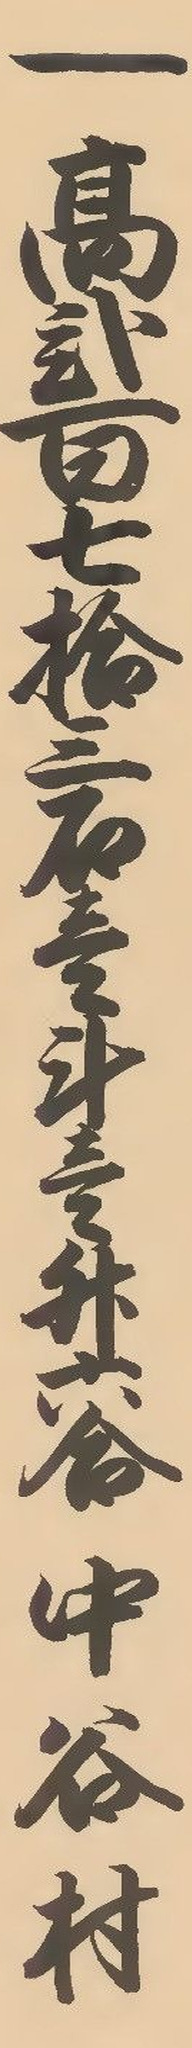一髙弐百七拾三石壱斗壱升六合中谷村

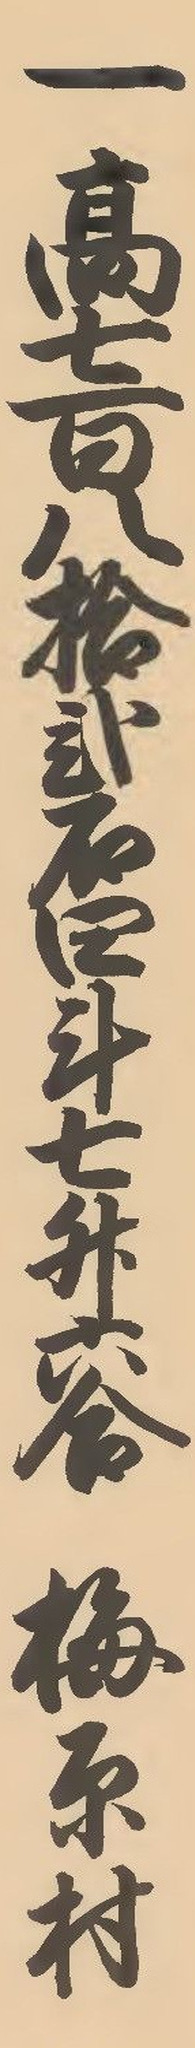一髙七百八拾弐石四斗七升六合梅原村
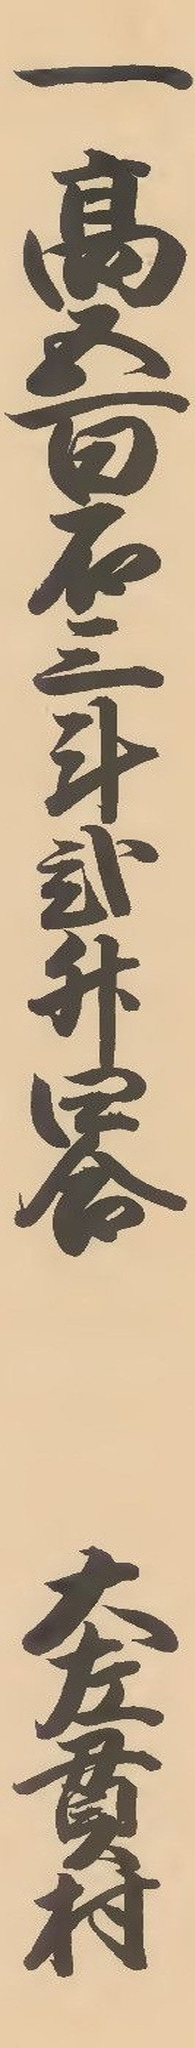一髙五百石三斗弐升四合大左貫村
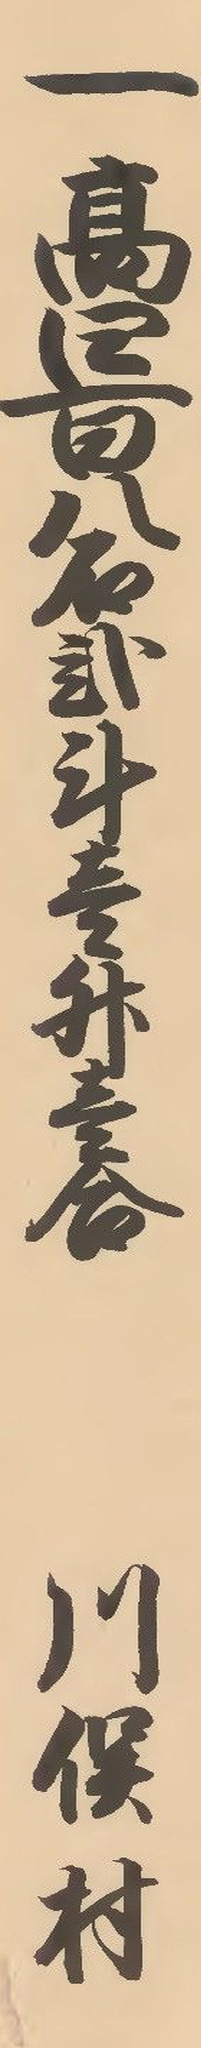一髙四百八石弐斗壱升壱合川俣村
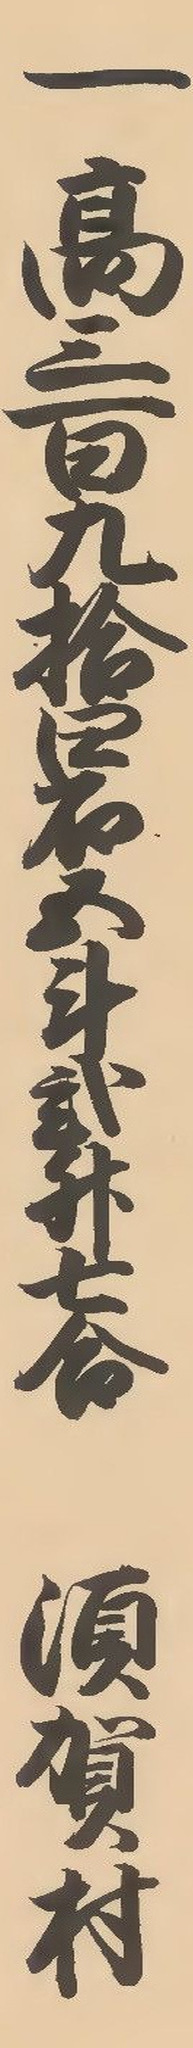一髙三百九拾四石五斗弐升七合須賀村
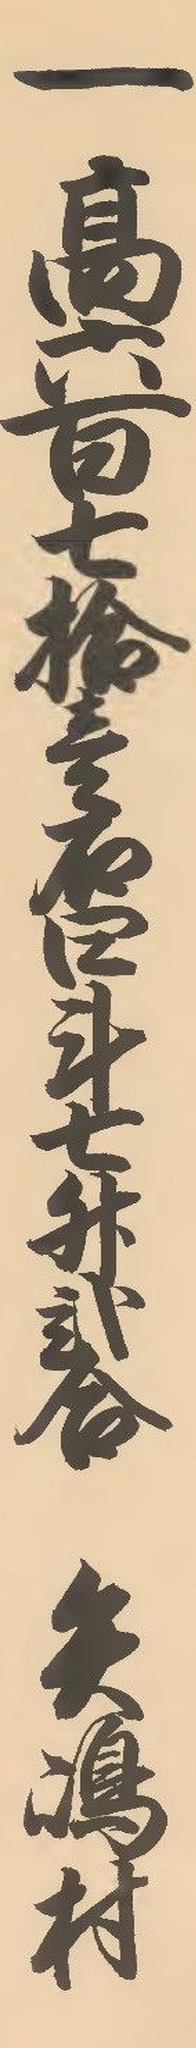一髙六百七拾壱石四斗七升弐合矢嶋村
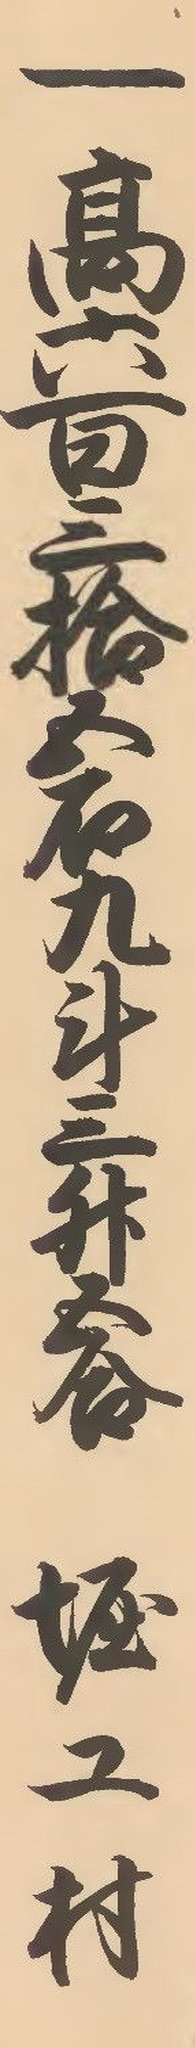一髙六百三拾五石九斗三升五合堀工村
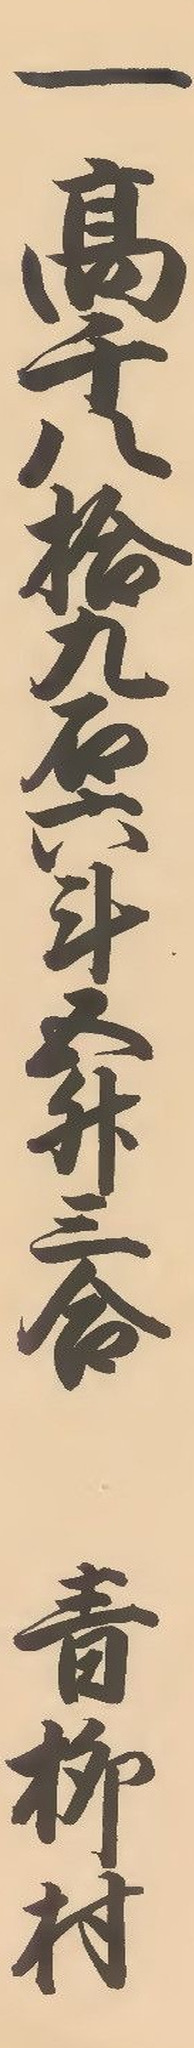一髙千八拾九石六斗五升三合青柳村
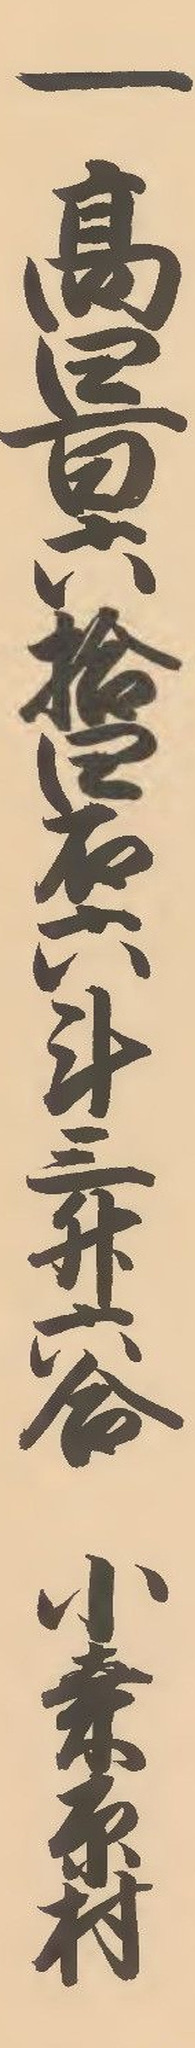一髙四百六拾四石六斗三升六合小桑原村

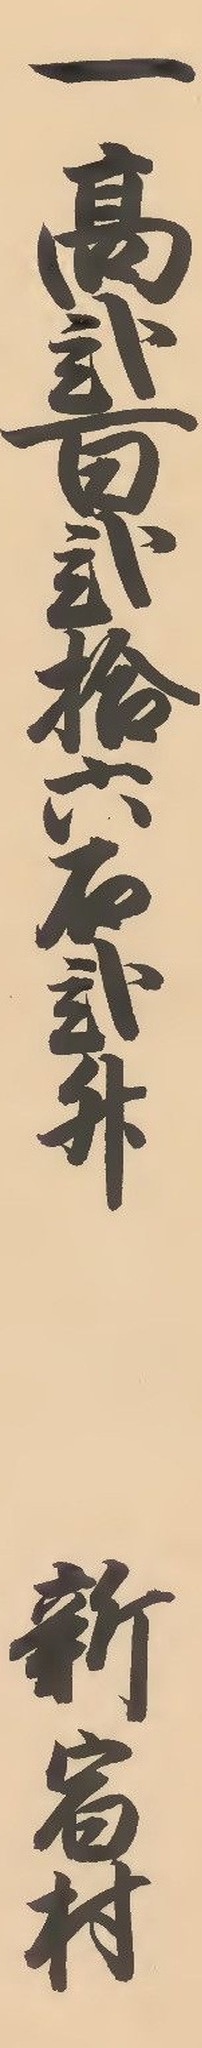一髙弐百弐拾六石弐升新宿村
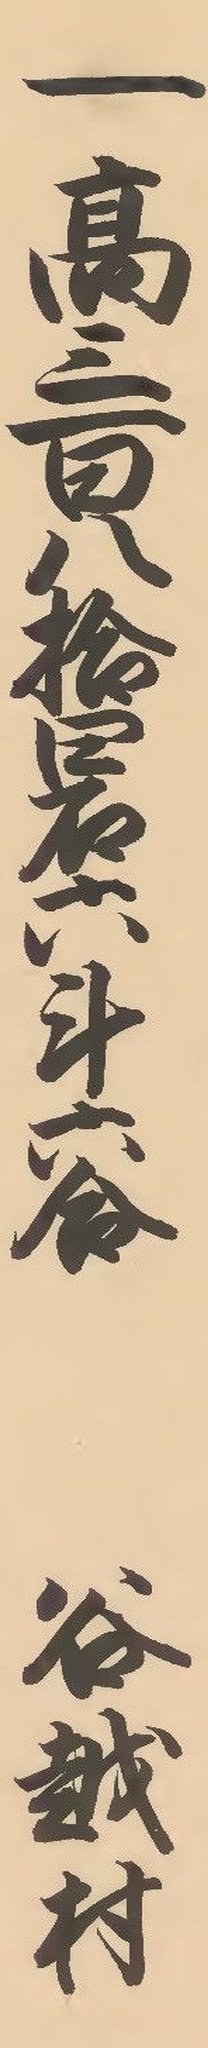一髙三百八拾四石六斗六合谷越村
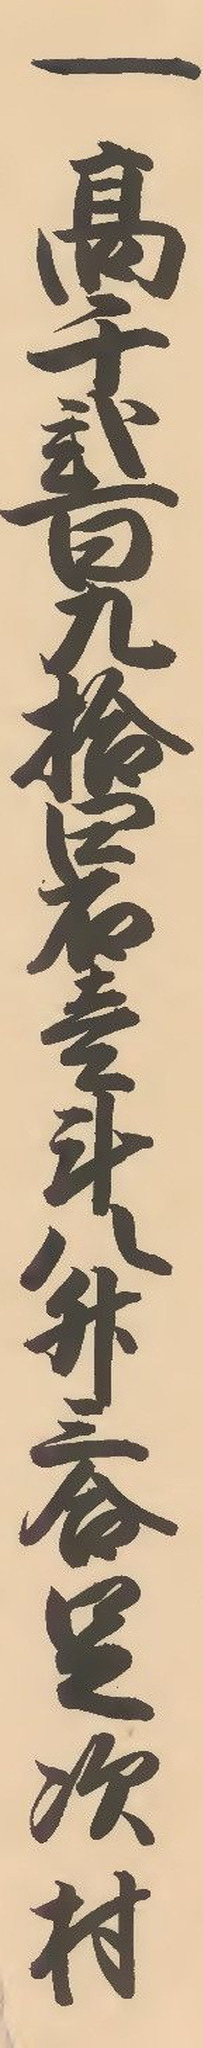一髙千弐百九拾四石壱斗八升三合足次村
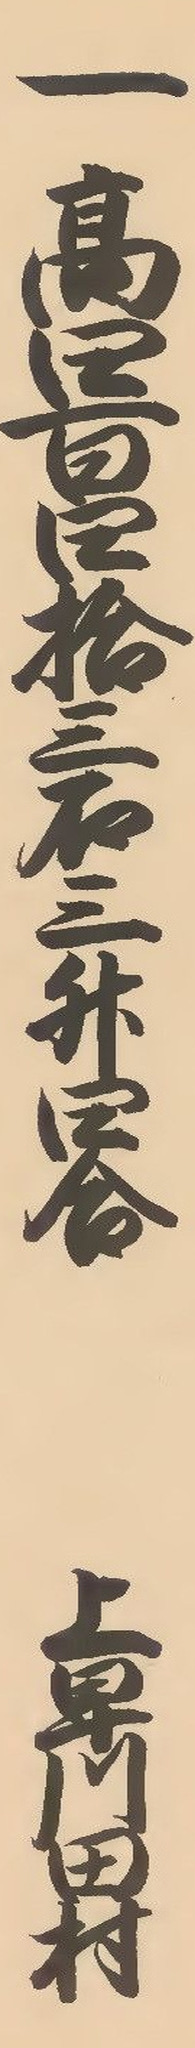一髙四百四拾三石三升四合上早川田村
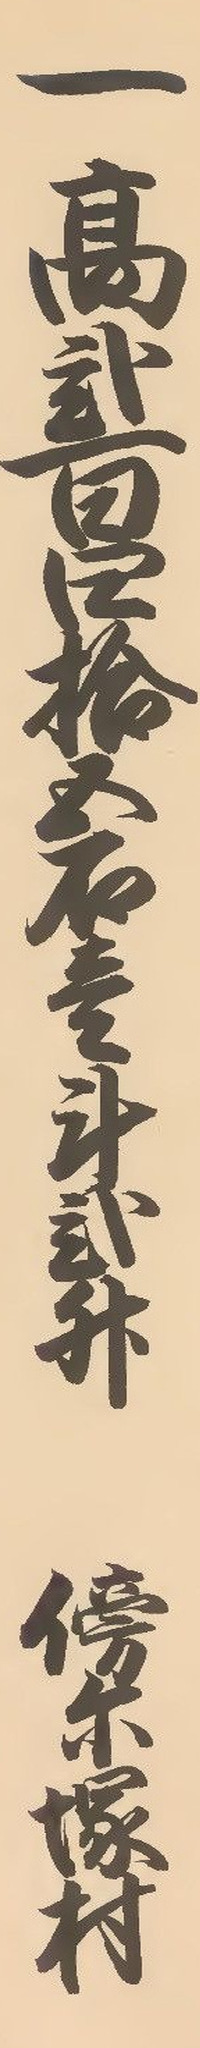一髙弐百四拾五石壱斗弐升傍示塚村
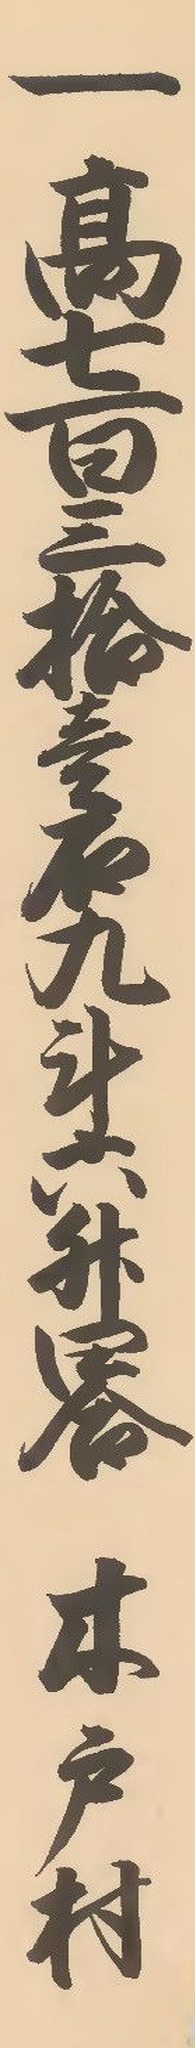一髙七百三拾壱石九斗六升四合木戸村
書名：上野国郷帳
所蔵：国立公文書館 National Archives of Japan
